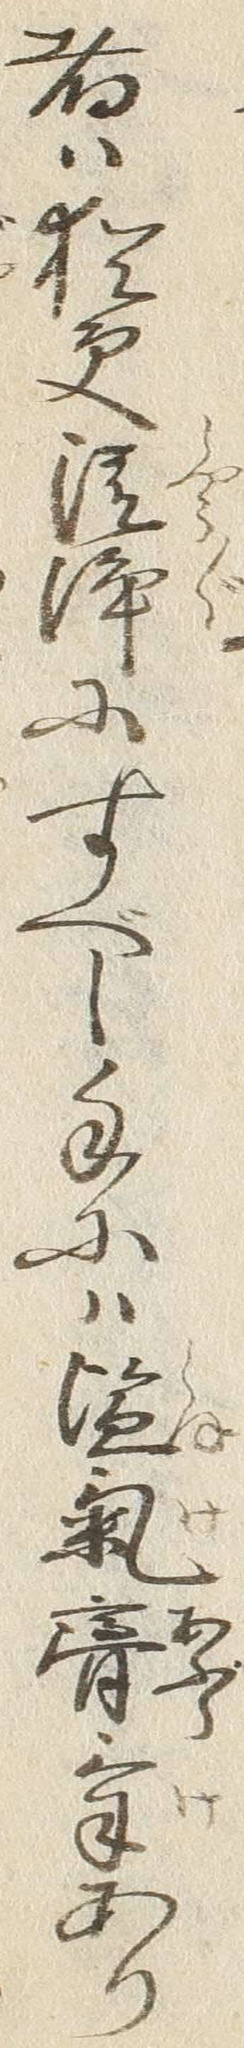者は猶更清浄尓すべし手尓は塩氣膏氣あり
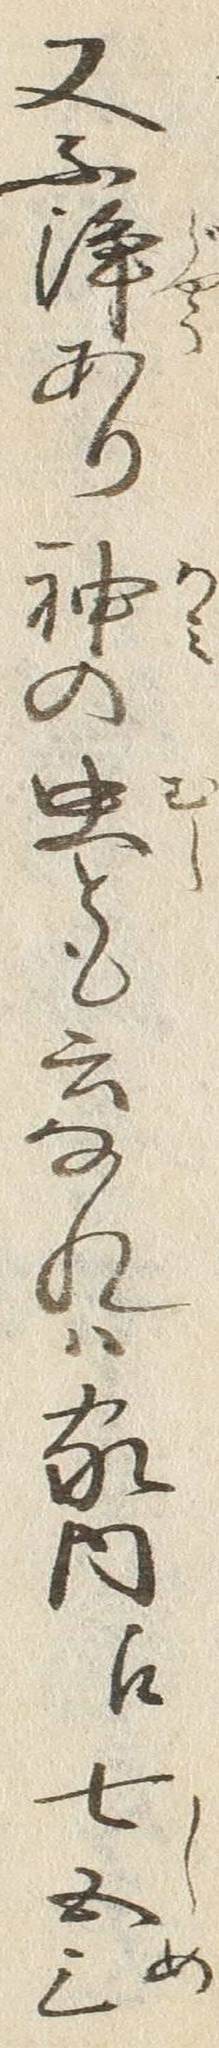又ふ浄あり神の虫とも云なれは家内江七五三
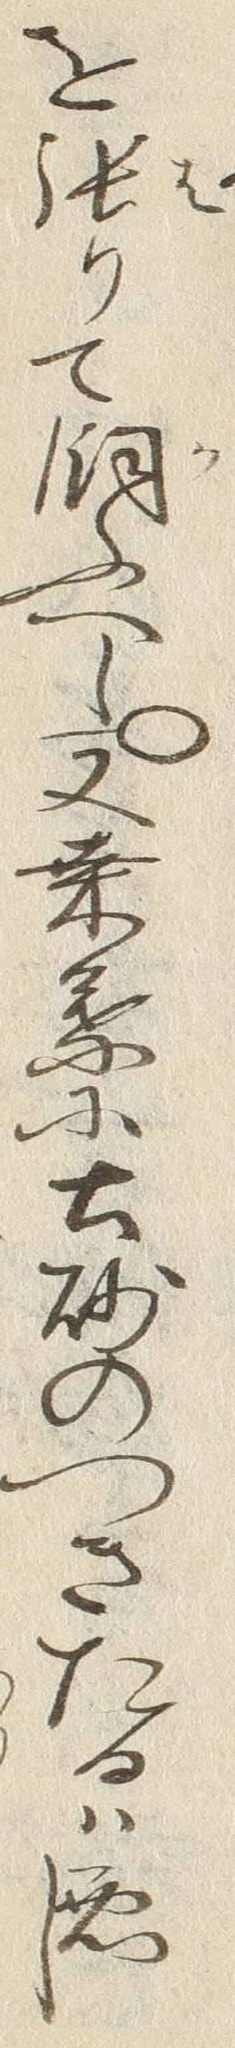を張りて飼ふへし〇又桑葉尓土砂のつきたるは悪し
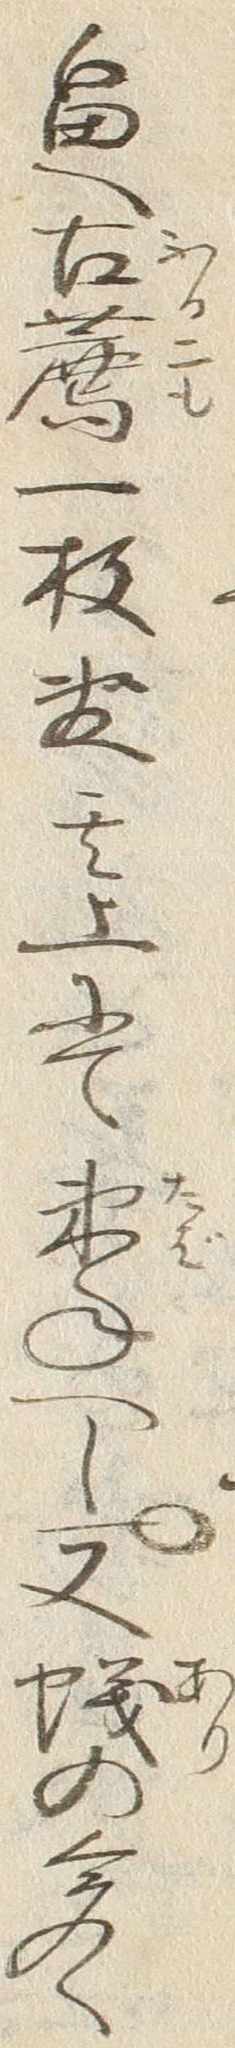畠へ古薦一枚敷其上尓て束年へし〇又蟻の多く
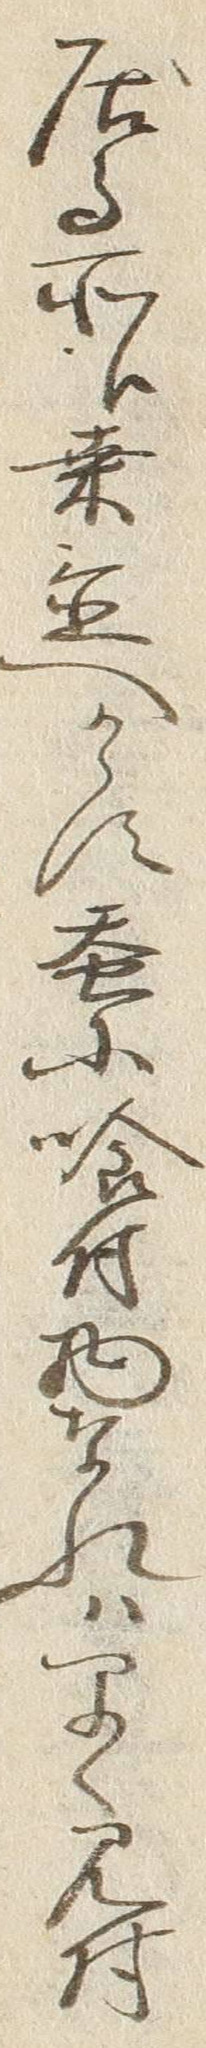居る所江桑置へから須蚕尓喰付物なれは早く見付
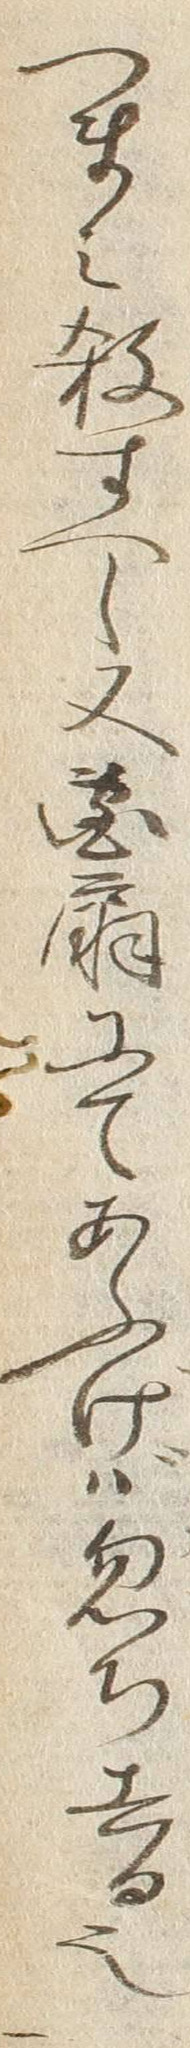つまみ殺すへし又団扇尓てあふげば忽ち去る也

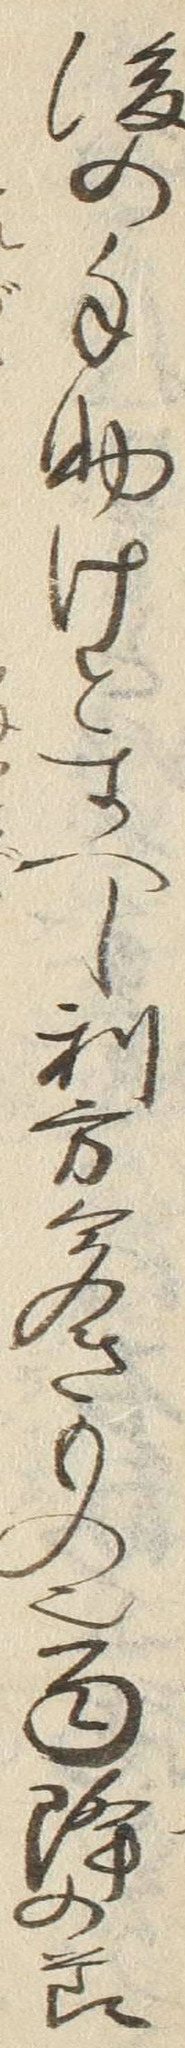後の手助けとすへし利方多きもの也雨降の節
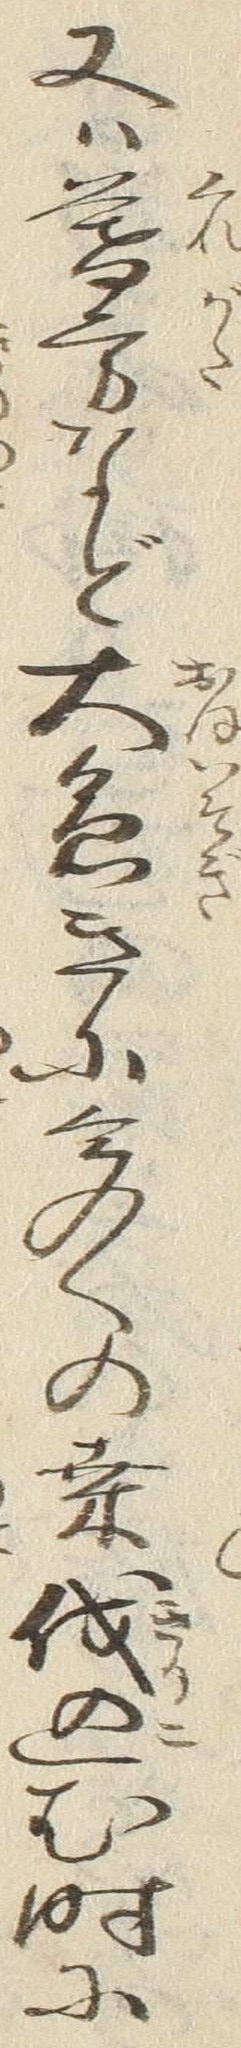又は暮方など大急き尓多くの桑伐込む時尓
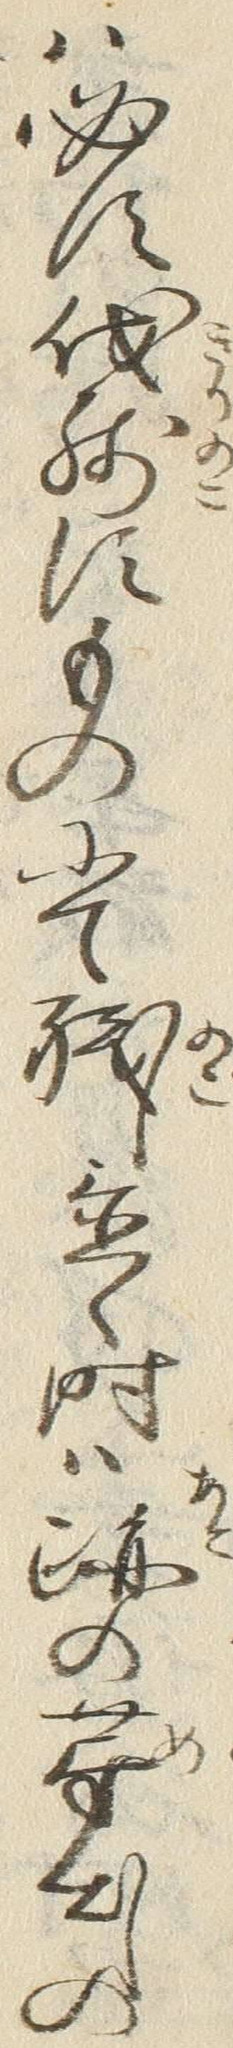は必須伐残須もの尓て残し置く時は跡の芽出しの
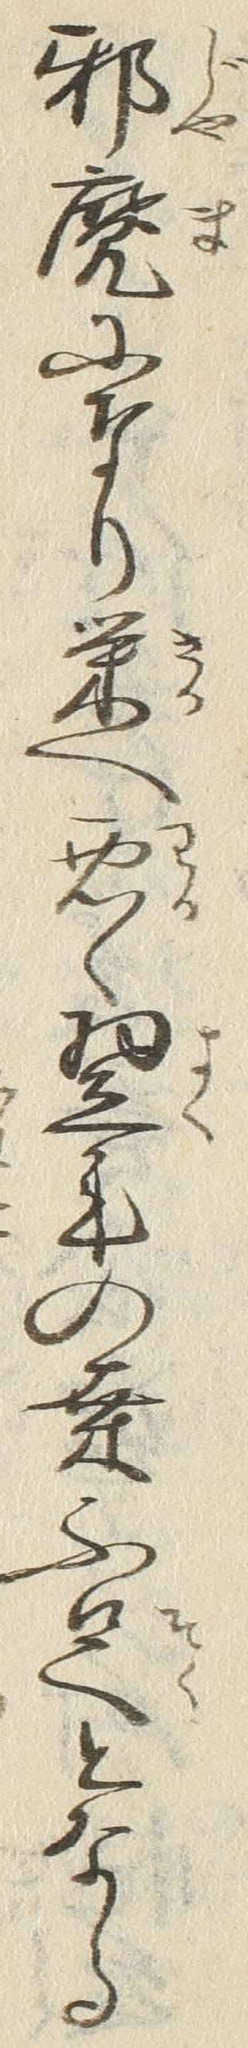邪魔尓なり栄へ悪く翌年の桑ふ足となる
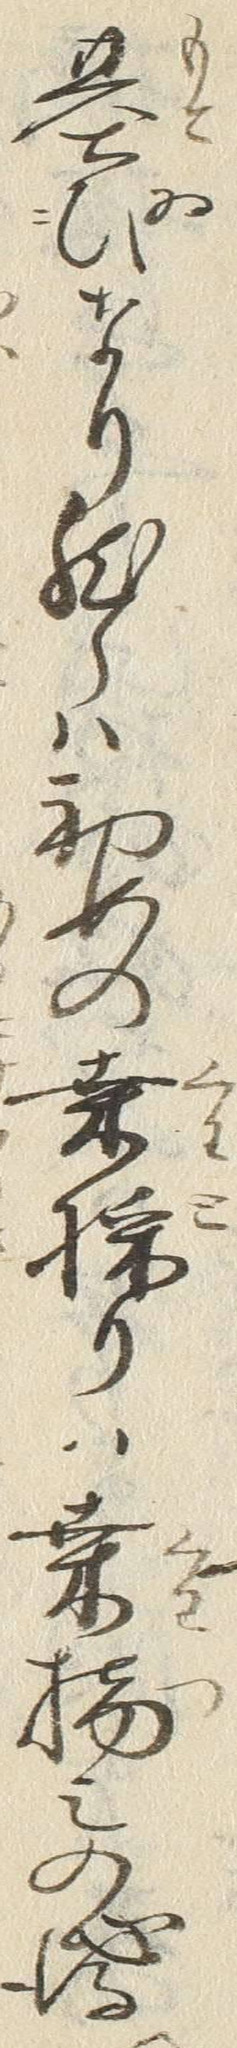基ひなり然らは初めの桑採りは桑摘みの心得
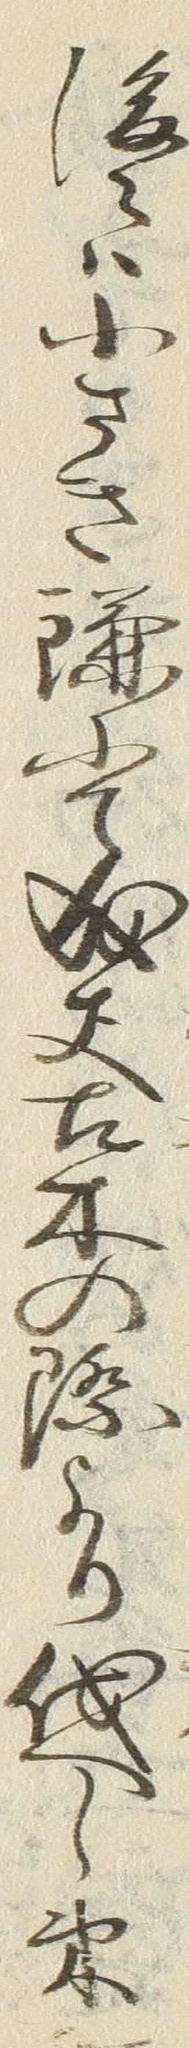後には小さき鎌尓て成丈古木の際より伐へし束
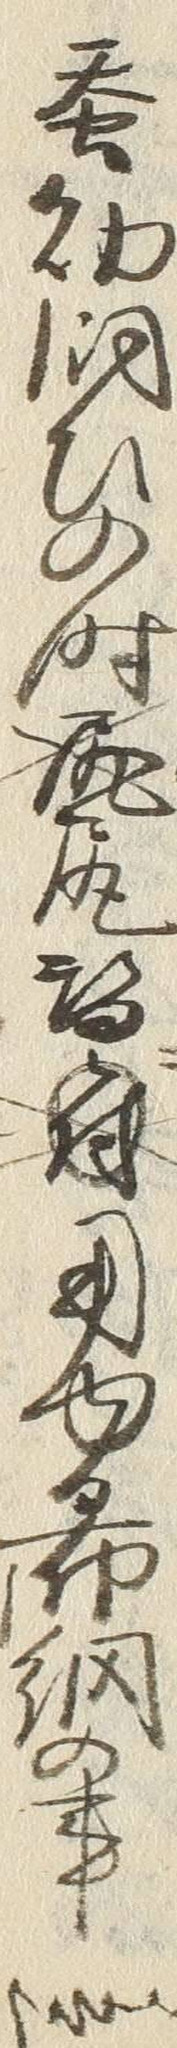蚕幼飼ひの時居尻替に用ゆる布網の事
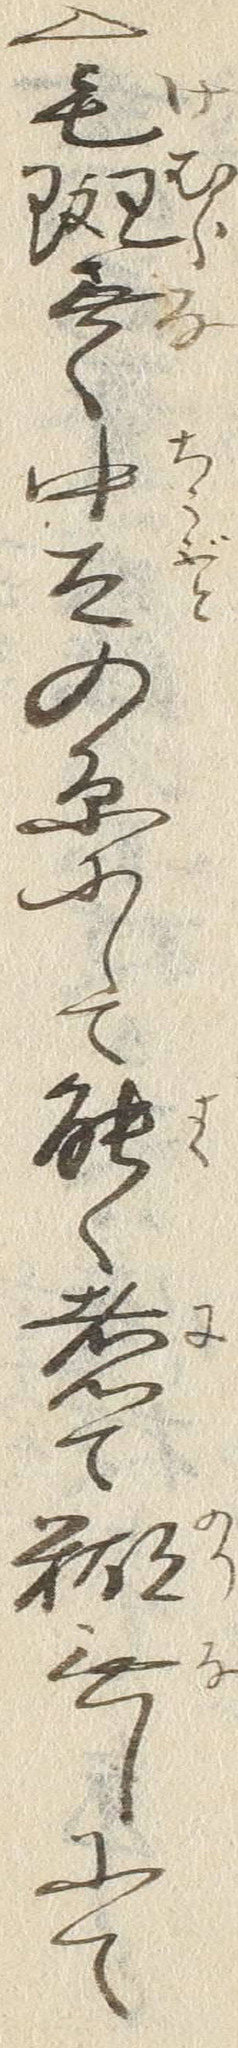毛斑無く中太の糸尓して能く煮て糊無し尓て
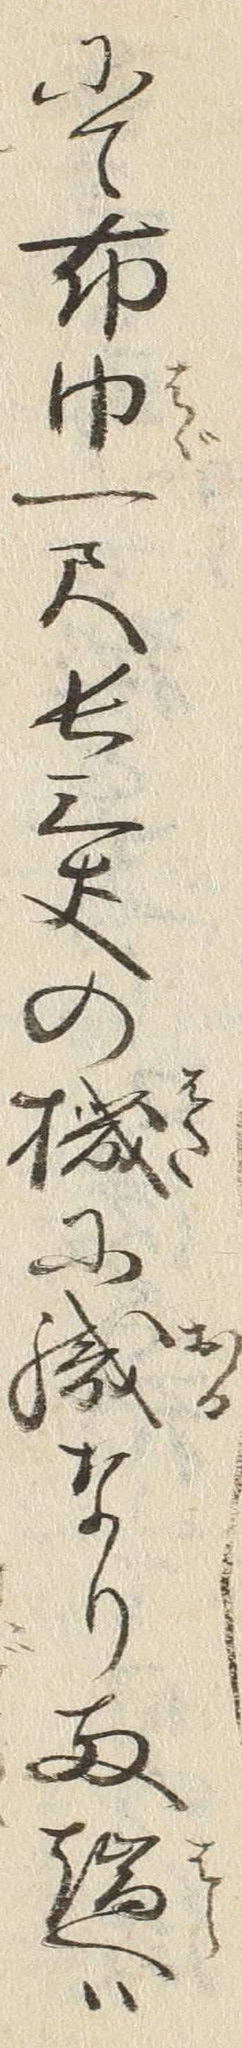尓て布巾一尺長三丈の機尓織なり両端へは
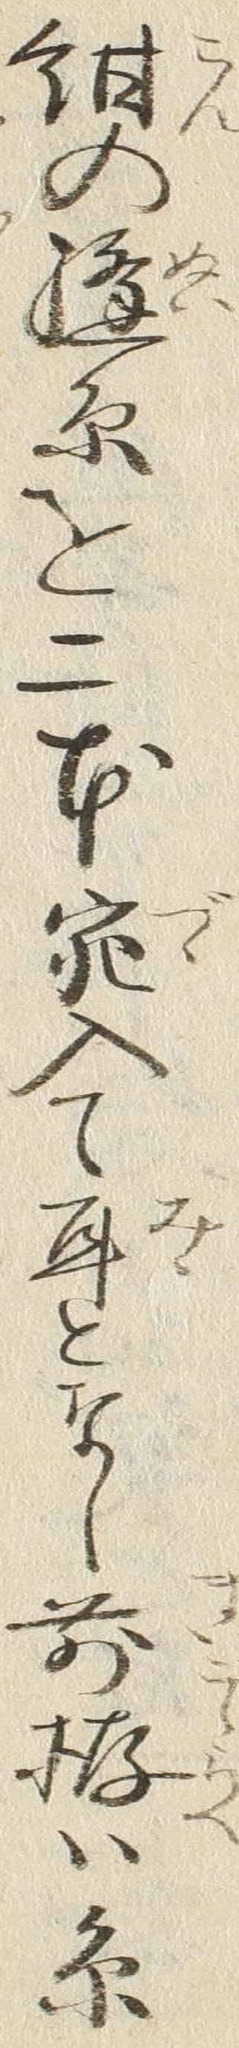紺の縫糸を二本宛入て耳となし前拵は糸
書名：養蠶實驗録後編
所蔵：東京大学農学生命科学図書館 国文学研究資料館
